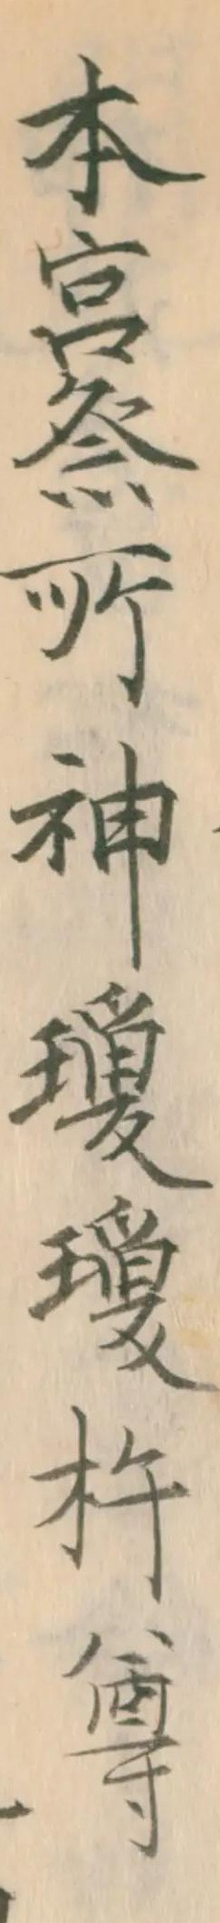本宮祭所神瓊瓊杵尊
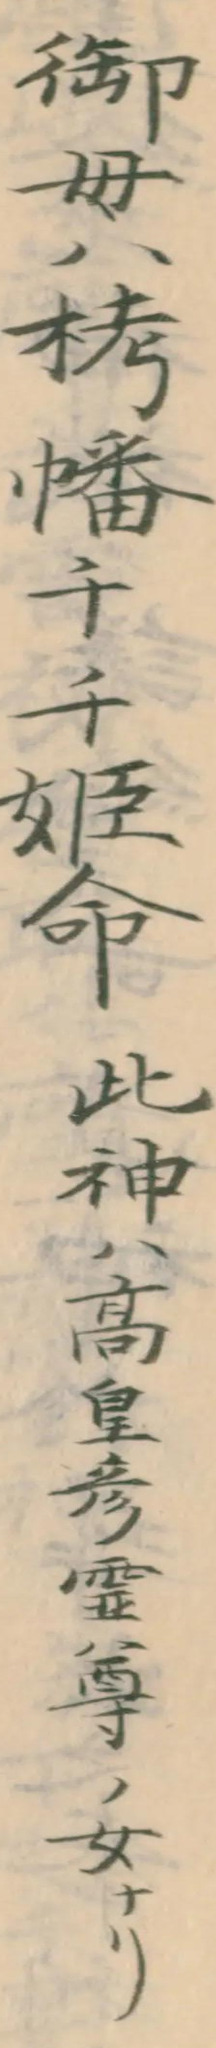御母ハ栲幡千千姫命此神ハ高皇彦霊尊ノ女ナリ
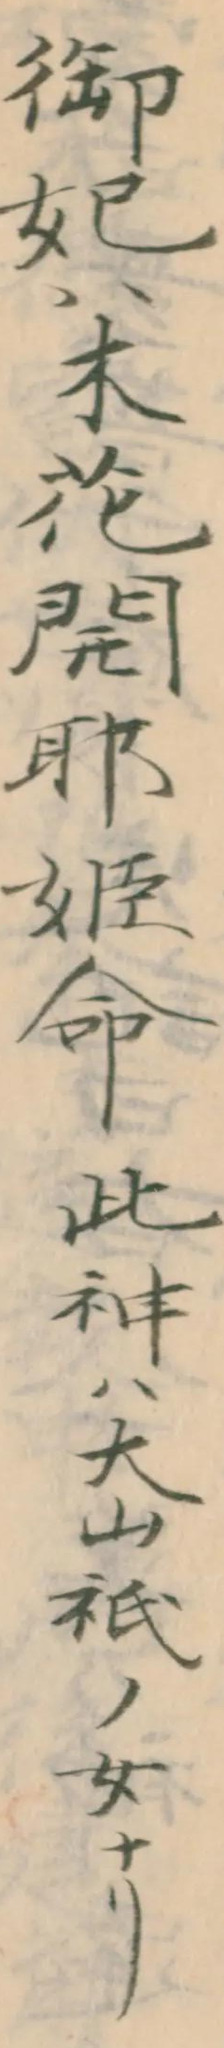御妃ハ木花開耶姫命此神ハ大山祇ノ女ナリ
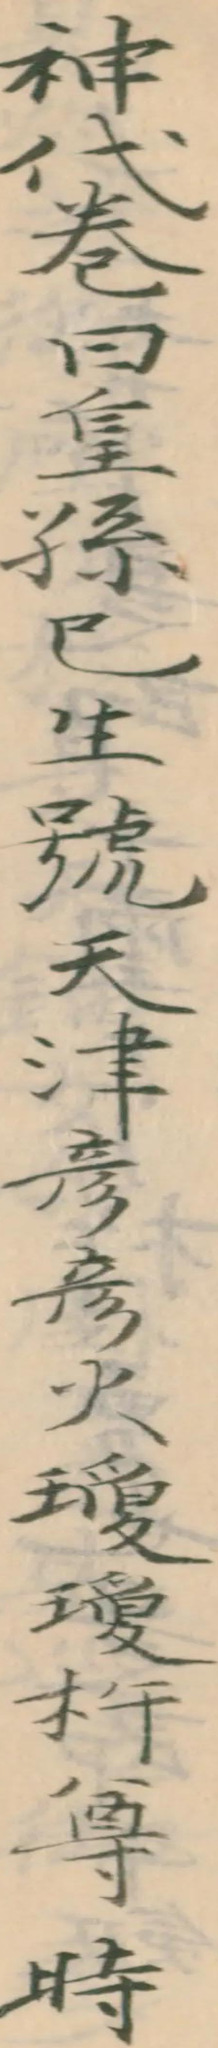神代巻曰皇孫巳生号天津彦彦火瓊杵尊時
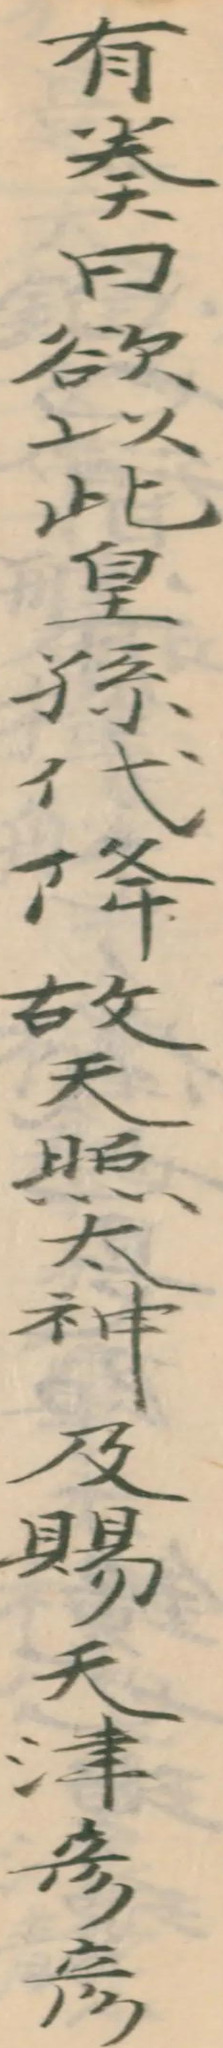有奏曰欲以此皇孫代降故天照太神及賜天津彦彦
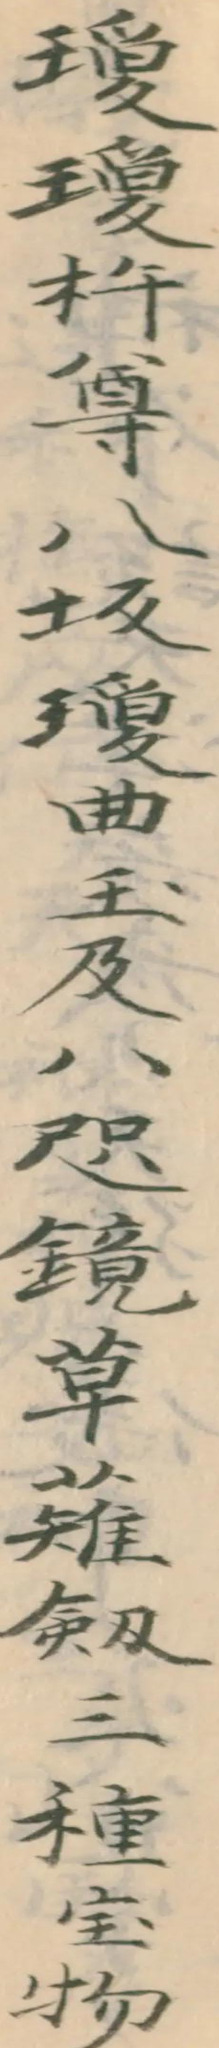瓊瓊杵尊八坂瓊曲玉及八咫鏡草薙剣三種宝物
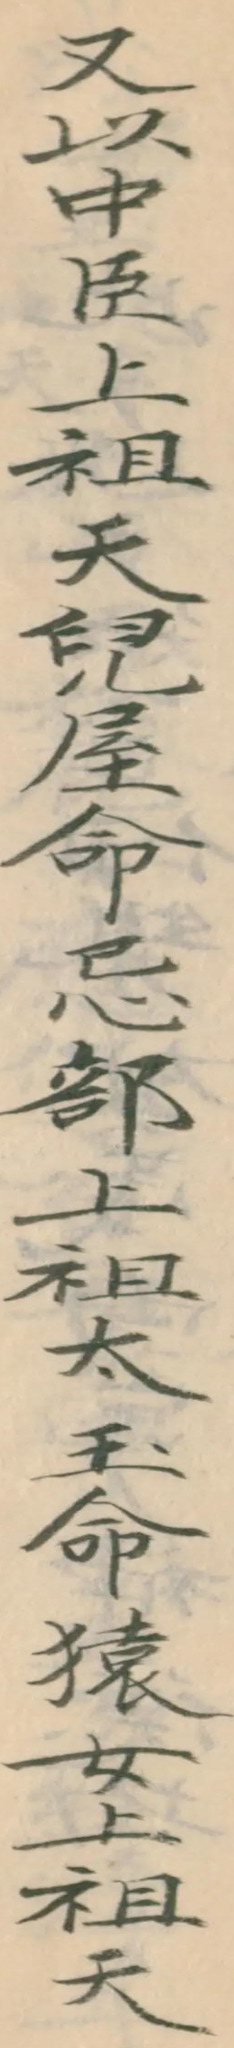又以中臣上祖天児屋命忌部上祖太玉命猿女上祖夭
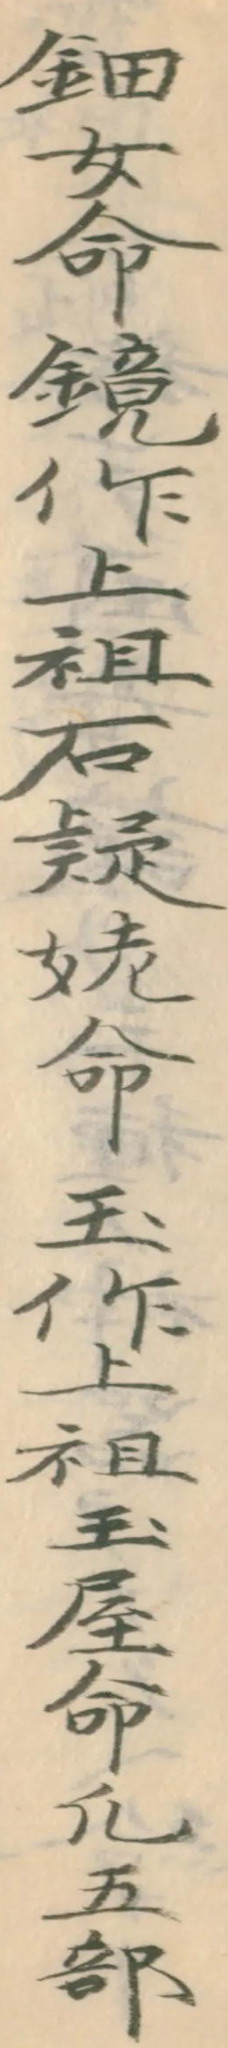鈿女命鏡作上祖石疑姥命玉作上視玉屋命凡五部
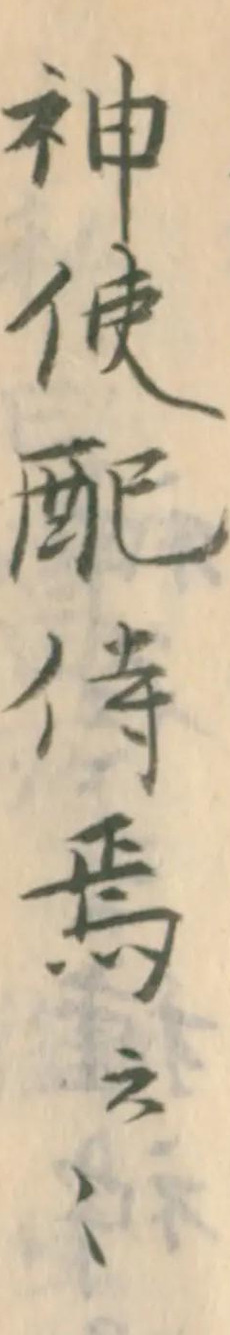神使配侍焉云々
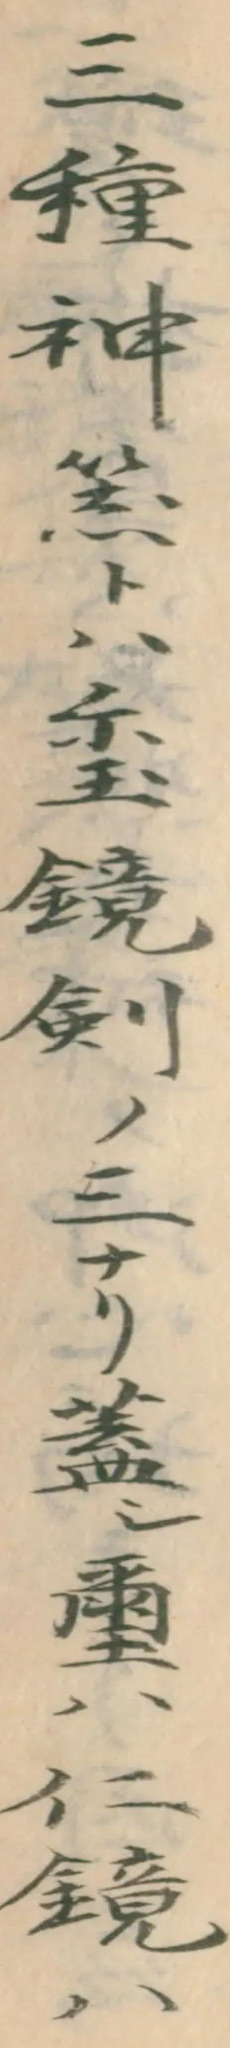三種神器トハ璽鏡剣ノ三ナリ蓋シ璽ハ仁鏡ハ
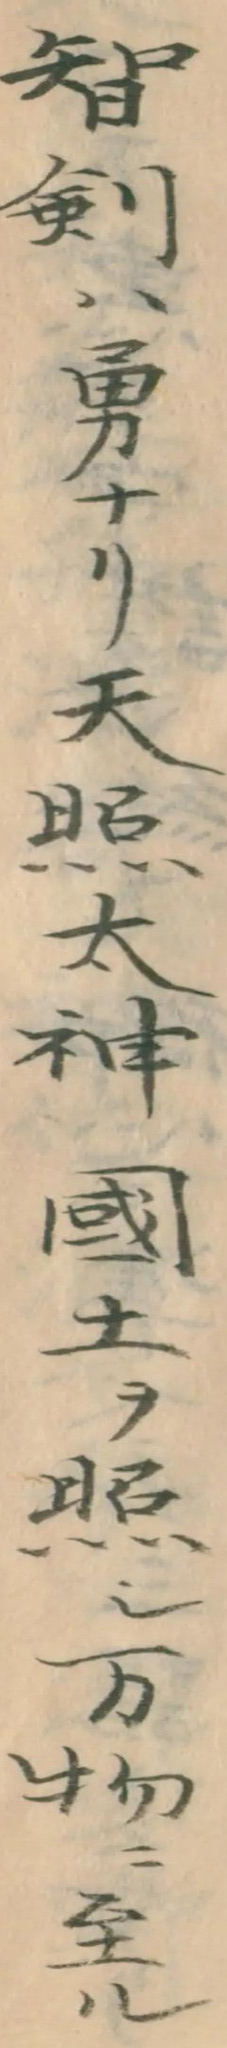智剣ハ勇ナリ天照太神国土ヲ照シ万物ニ至ル

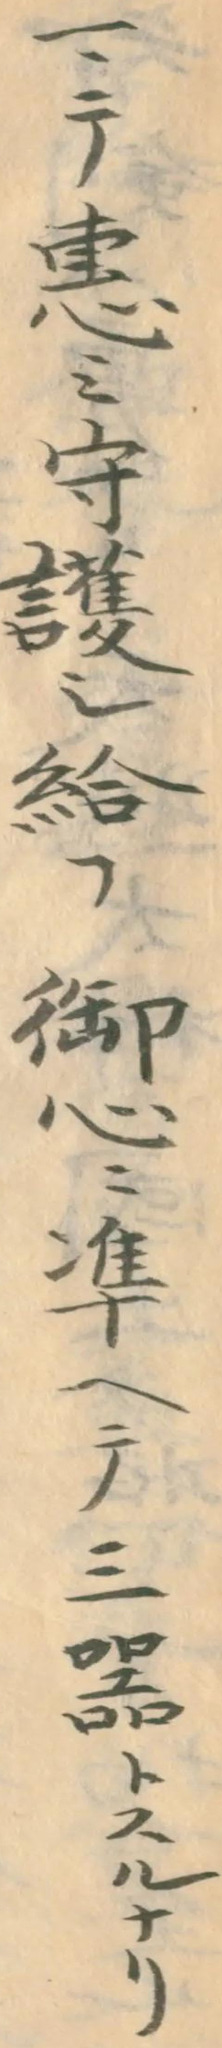マテ恵ミ守護シ給フ御心ニ準ヘテ三器トスルナリ
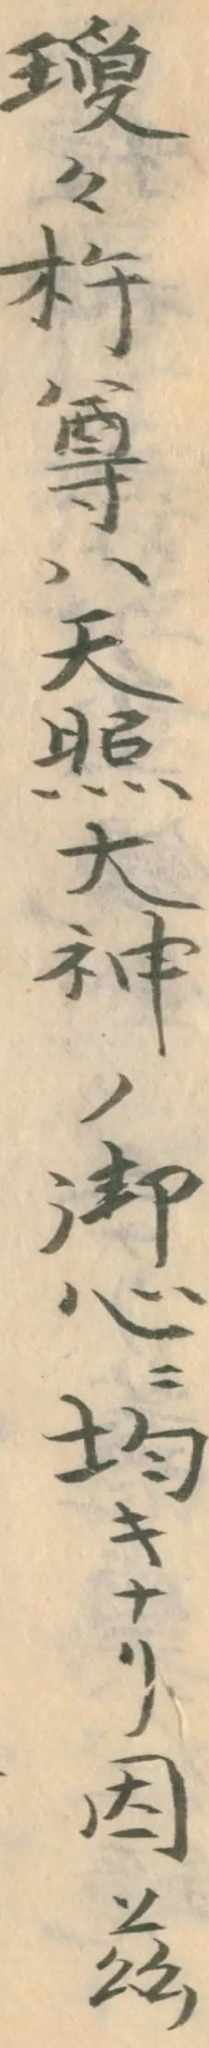瓊々杵尊ハ天照大神ノ御心ニ均キナリ因茲
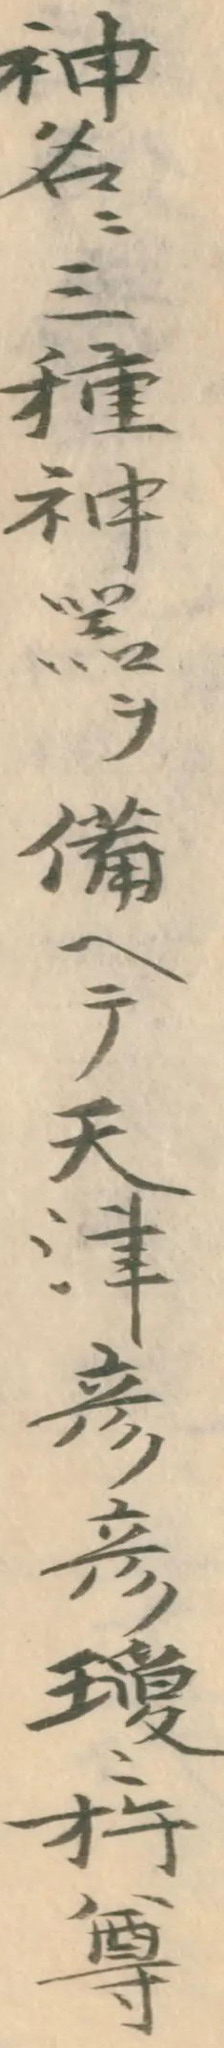神名ニ三種神器ヲ備へテ天津彦彦瓊々杵尊
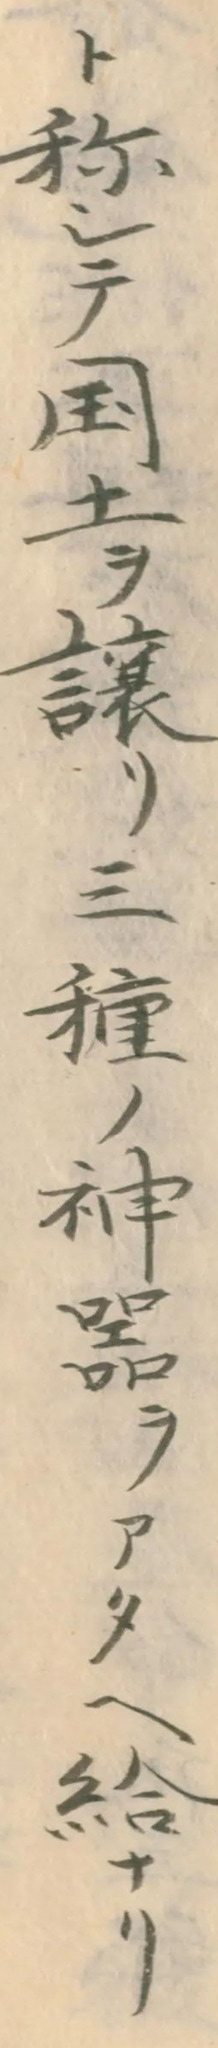ト称シテ国土ヲ譲リ三種ノ神器ヲアタヘ給ナリ
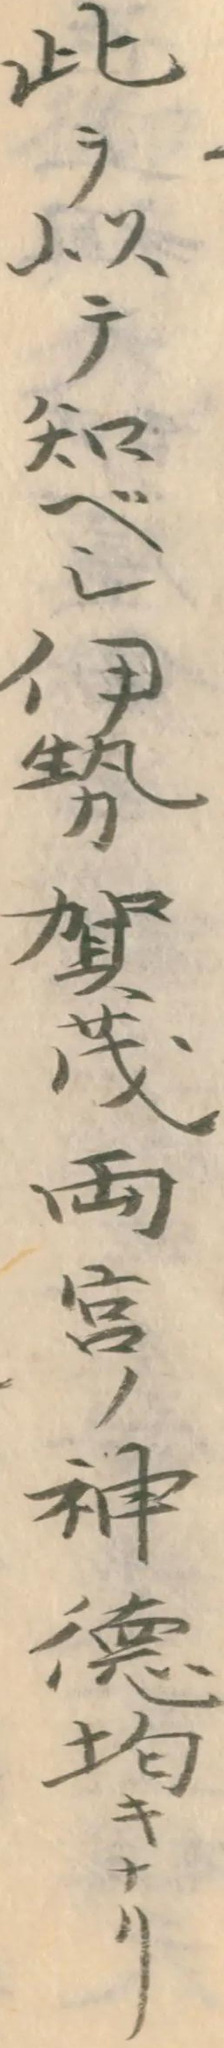此ヲ以テ知ベシ伊勢賀茂両宮ノ神徳均キナリ
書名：賀茂社記録. 第91冊
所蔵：国立国会図書館 National Diet Library, JAPAN
